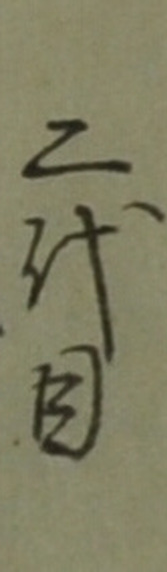二代目
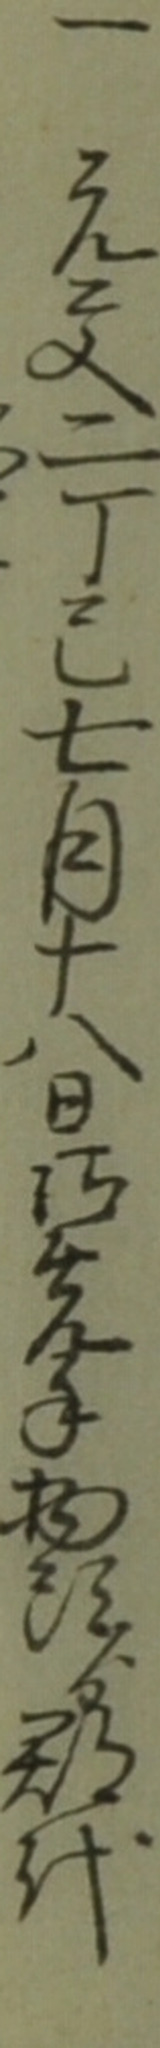一元文二丁巳七月十八日御先手物頭ゟ郡代
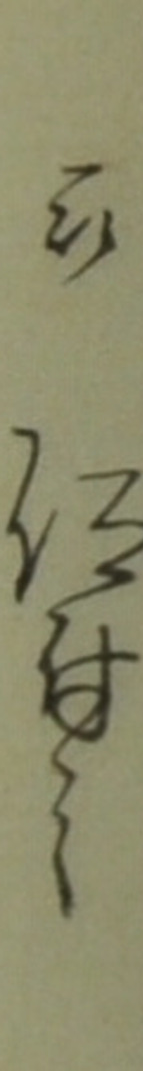被仰付之
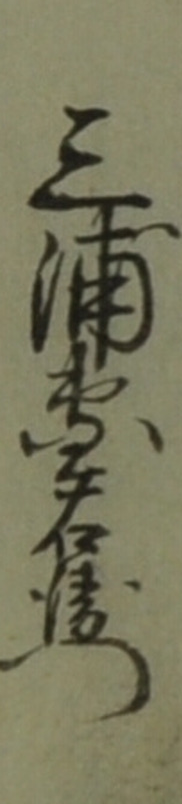三浦團右衛門

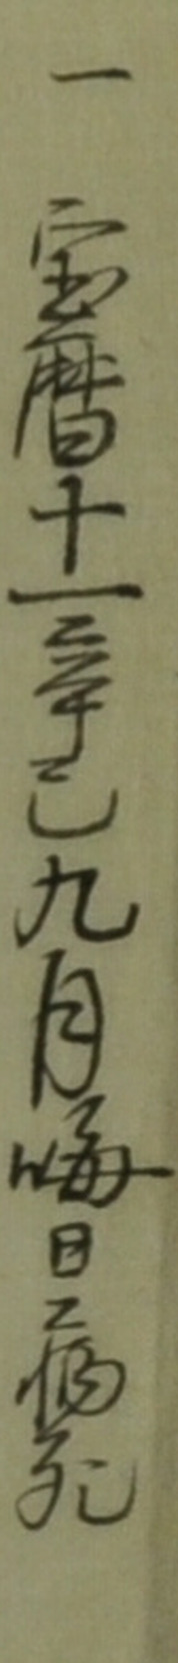一宝暦十一辛巳九月晦日病死
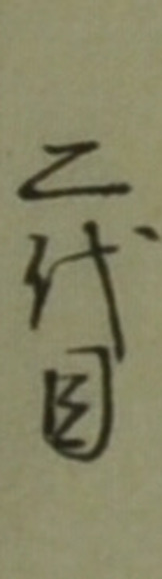二代目
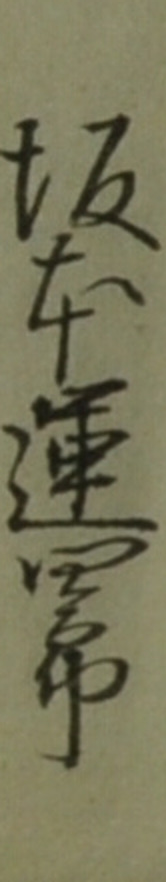坂本蓮四郎
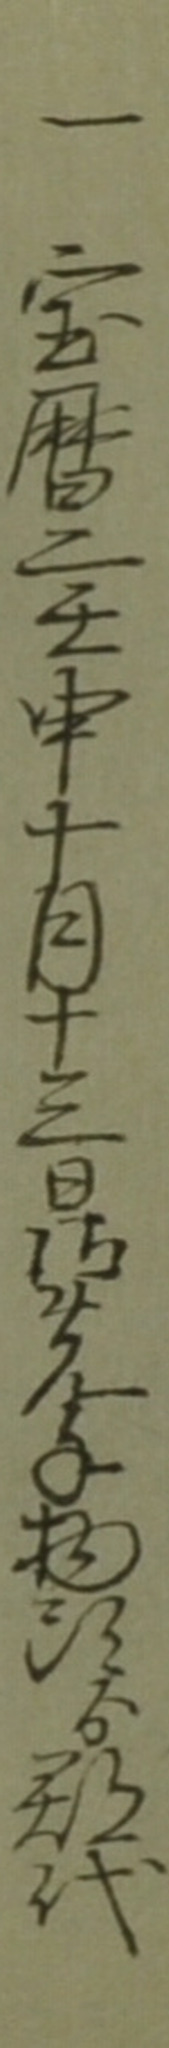一宝暦二壬申十月十三日御先手物頭ゟ郡代
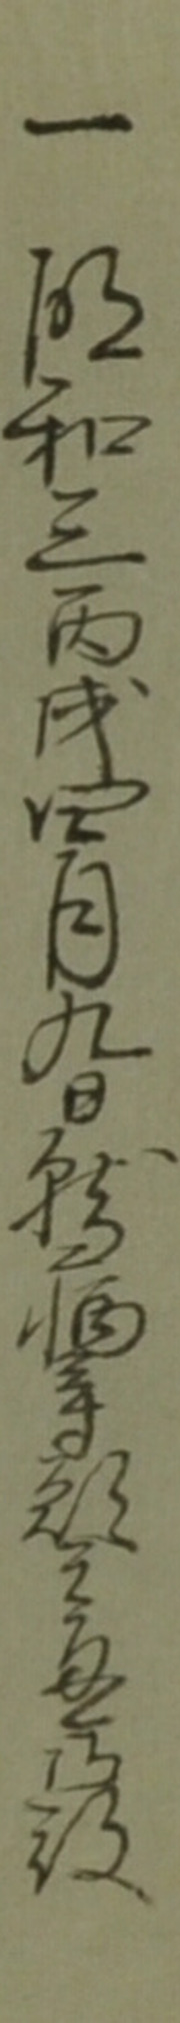一明和三丙四月九日就病気願之通御役
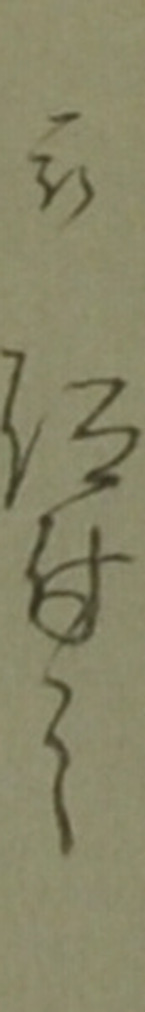被仰付之
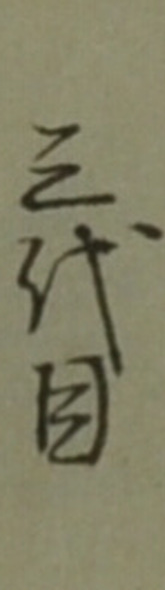三代目
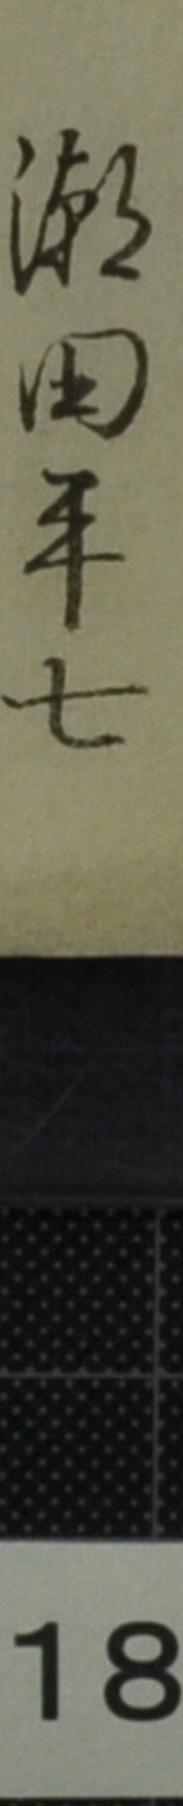潮田平七
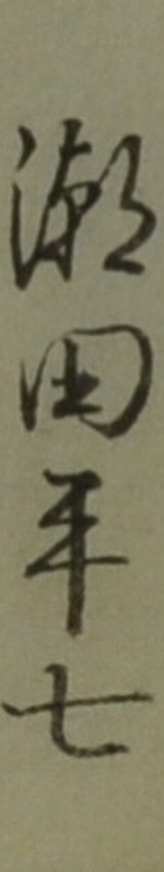潮田平七
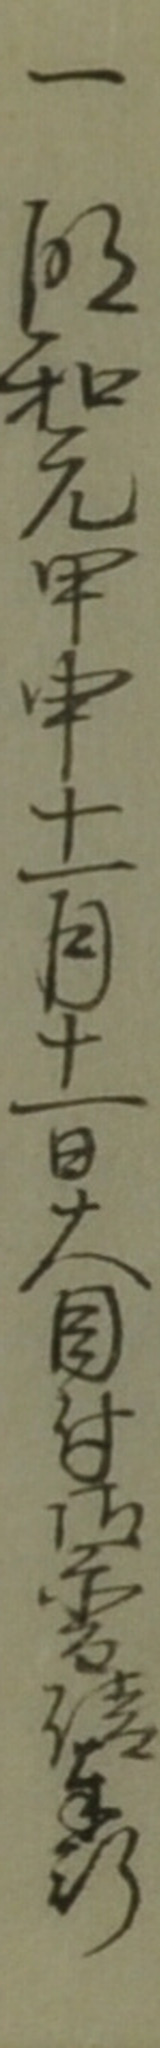一明和元甲申十一月十一日大目付御普請奉行
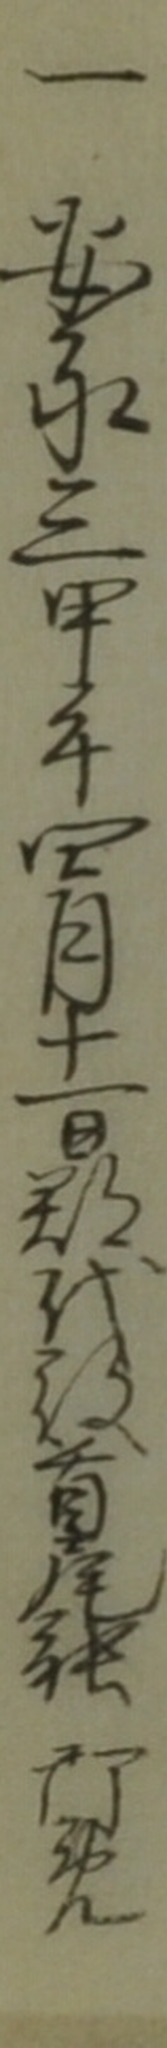一安永三甲午四月十一日郡代役首尾能御免
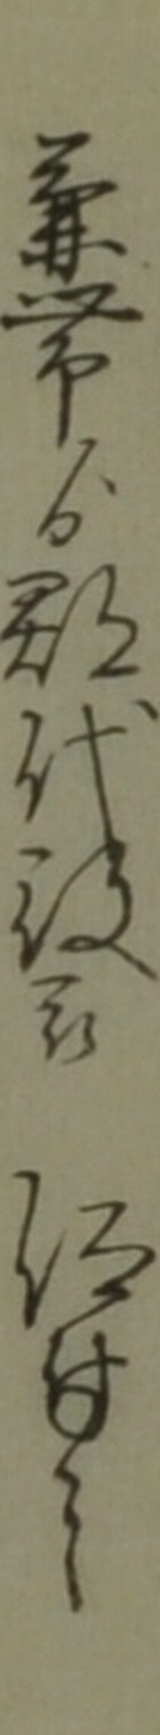兼帯ゟ郡代役被仰付之
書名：諸御役代々録（二）
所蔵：伊那市立高遠町図書館・合同会社AMANE
